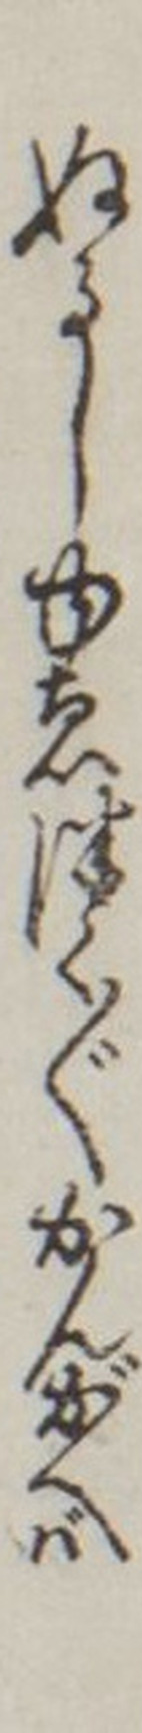ぬるしゆゑつく〴〵かんがへば
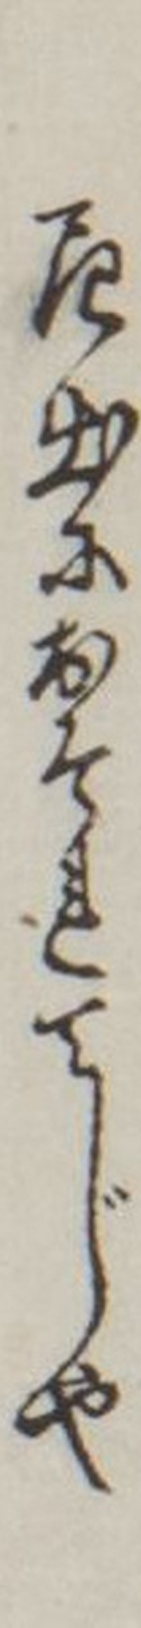尼出におそれてじや
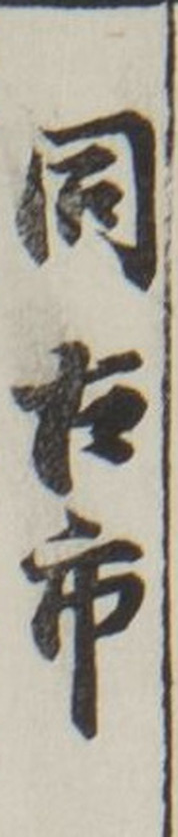同古市
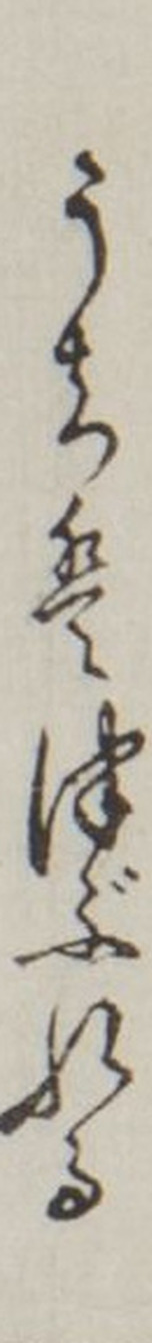うちはつぶれる
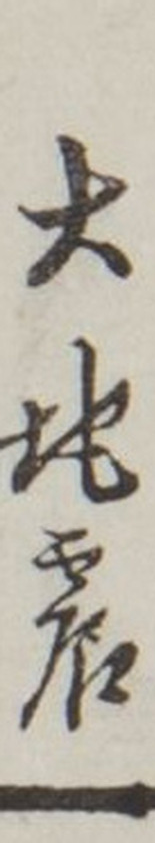大地震
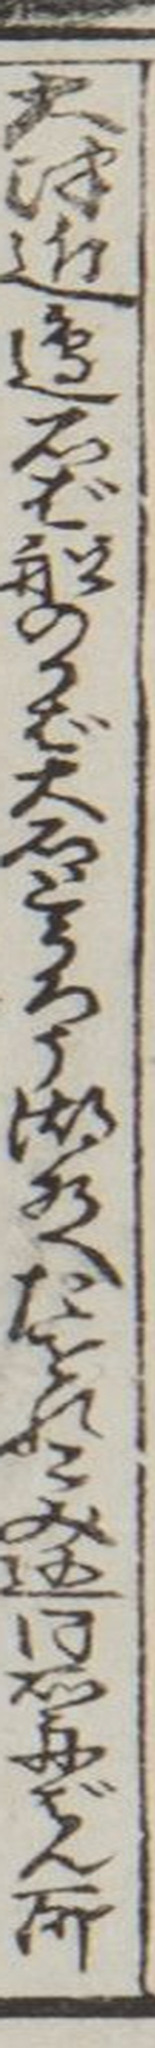大津近辺石ば船のかば大石とうろう湖水へたをれこみ辺同石舟ばん所
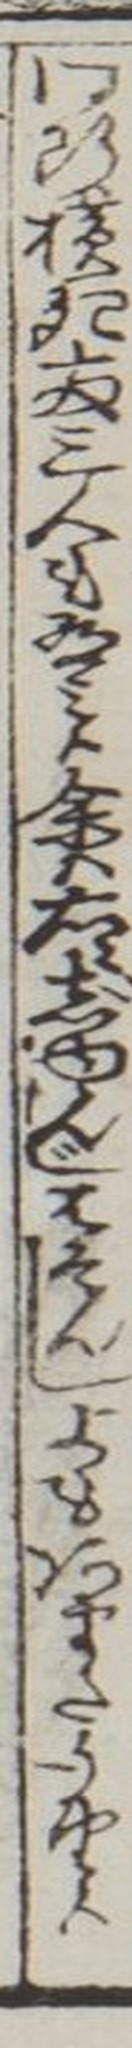同断横死両三人も有之候余は右にじゆんじはそんしよもあまた御坐候
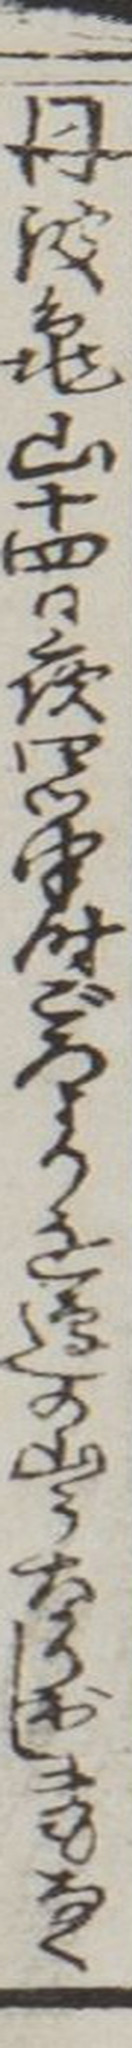丹波亀山十四日夜四ッ半時ごろより近辺の山うなり出しまもなく
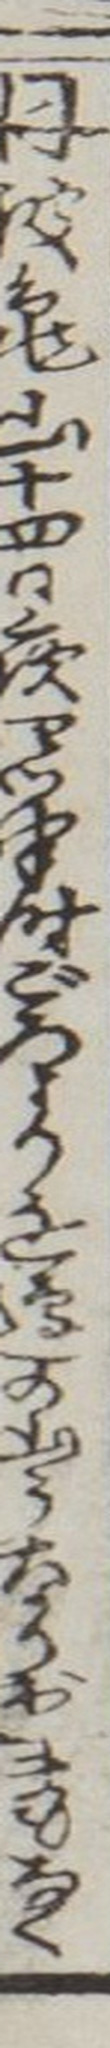丹波亀山十四日夜四ッ半時ごろより近辺の山うなり出しまもなく
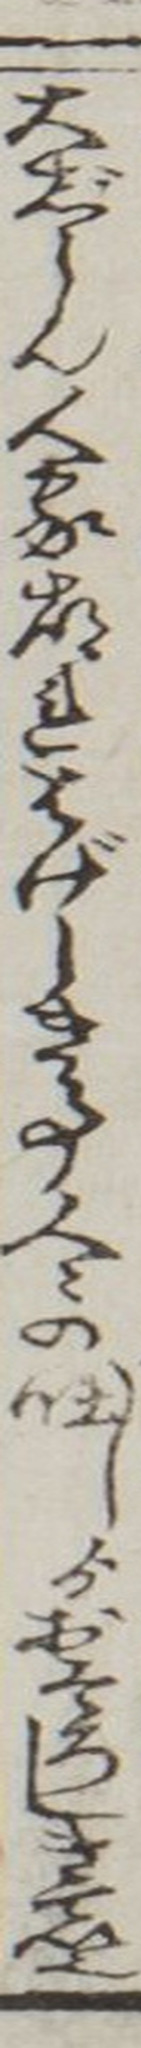大じしん人家崩れはげしき事人々の咄しよりおそろしきてい也
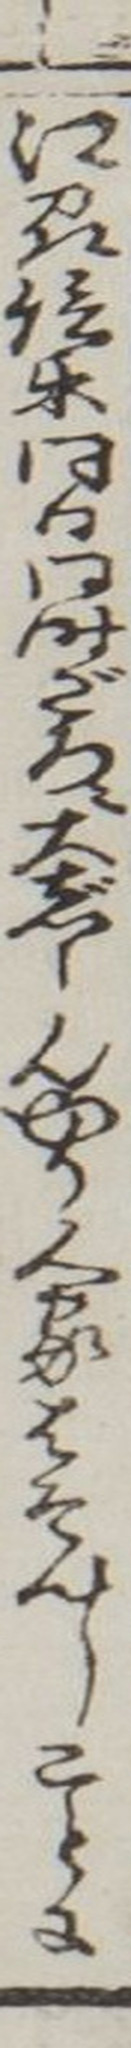江州信楽同日同時ごろに大じしんゆり人家はそんしことに
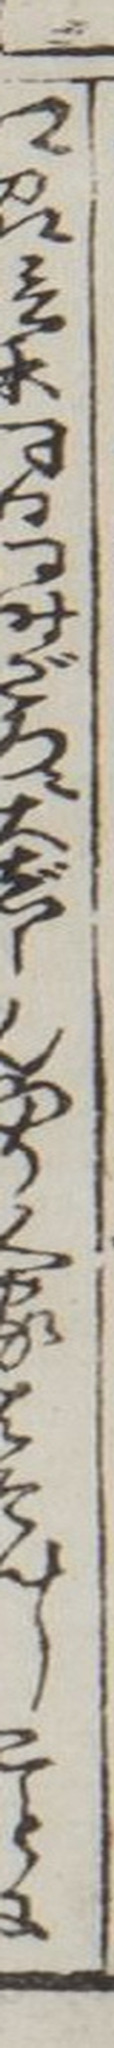江州信楽同日同時ごろに大じしんゆり人家はそんしことに
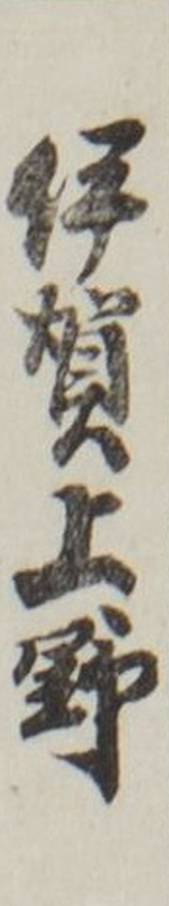伊賀上野
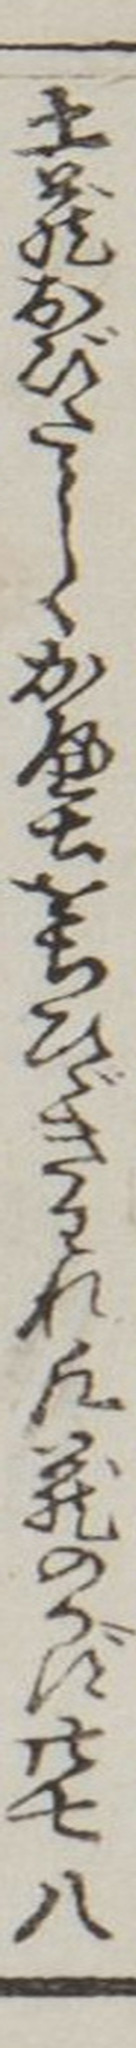土蔵おびたゝしくかへ土をちひゞきわれ凡蔵のかず廿七八
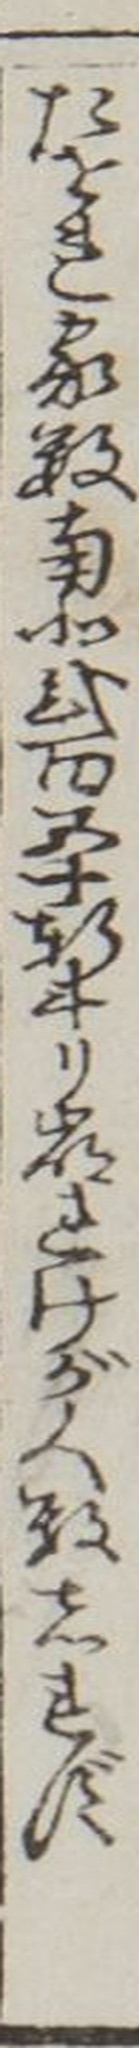たをれ家数南北弐百五十軒計り崩れけが人数しれず
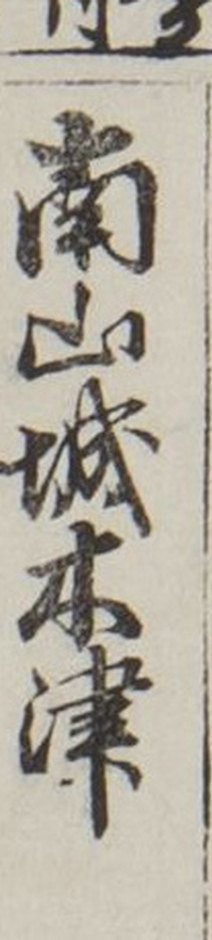南山城木津
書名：早飛脚廻りにてくわしき所本しらべ大地震
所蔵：あいおいニッセイ同和損保株式会社
